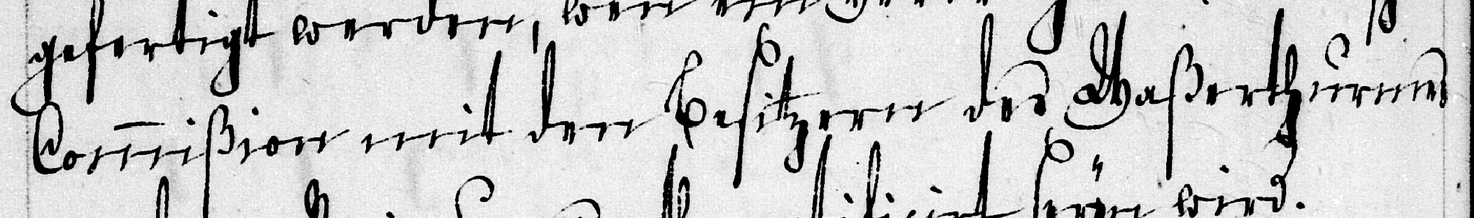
Commißion mit den Besitzern des Waßerthurmes
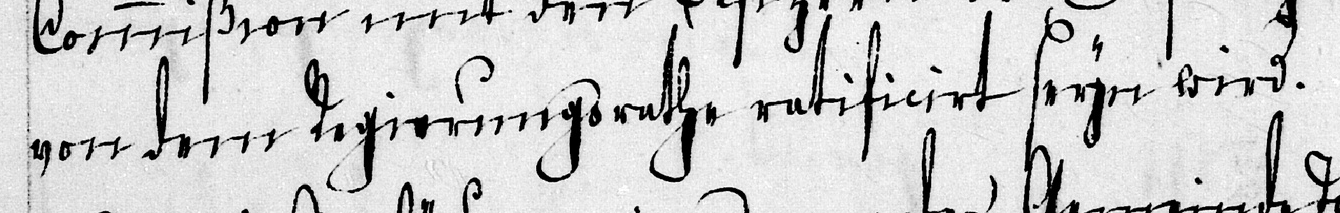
von dem Regierungsrathe ratificirt seyn wird.
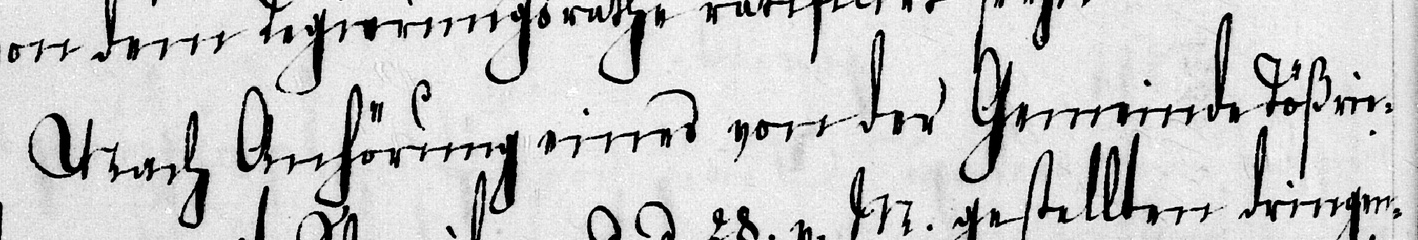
Nach Anhörung eines von der Gemeinde Tößrie¬
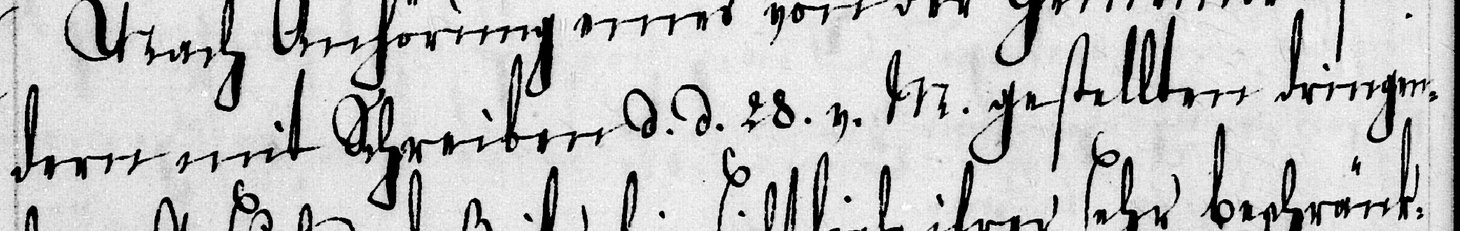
dern mit Schreiben d. d. 28. v. M. gestellten dringen¬
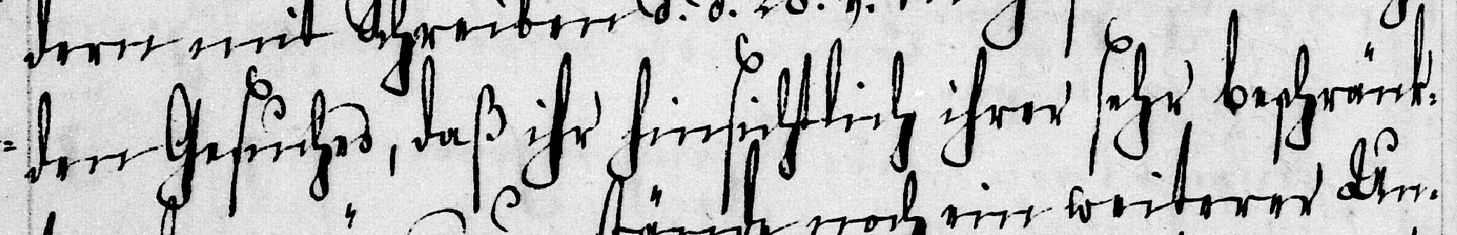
den Gesuches, daß ihr hinsichtlich ihrer sehr be¬
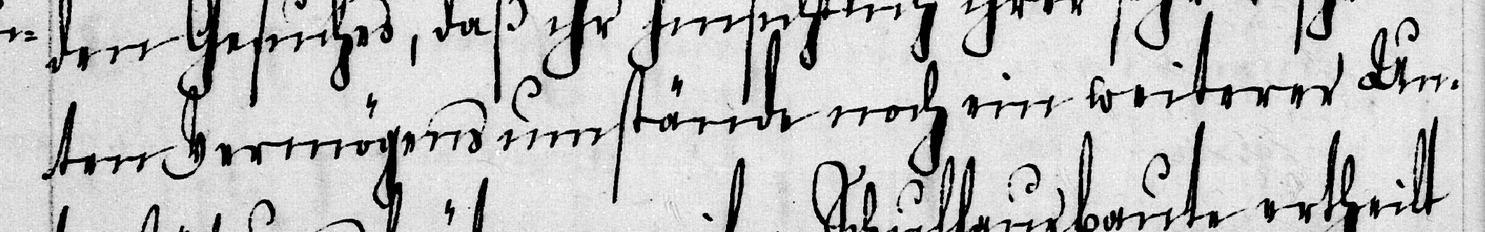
kten Vermögensumstände noch ein weiterer Un¬
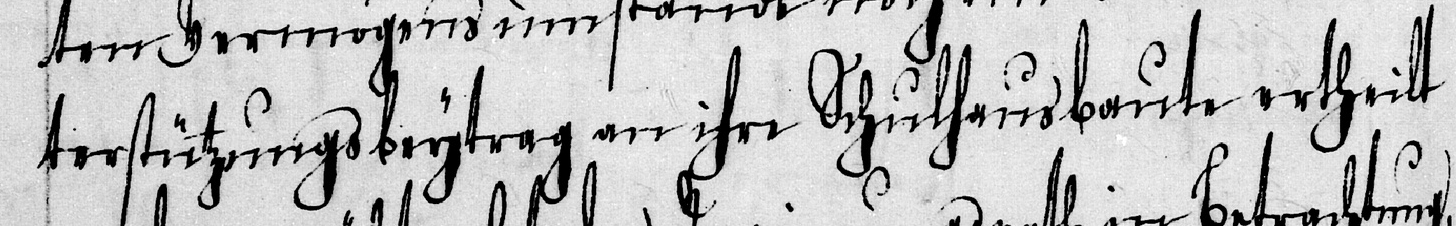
terstützungsbeytrag an ihre Schulhausbaute ertheilt
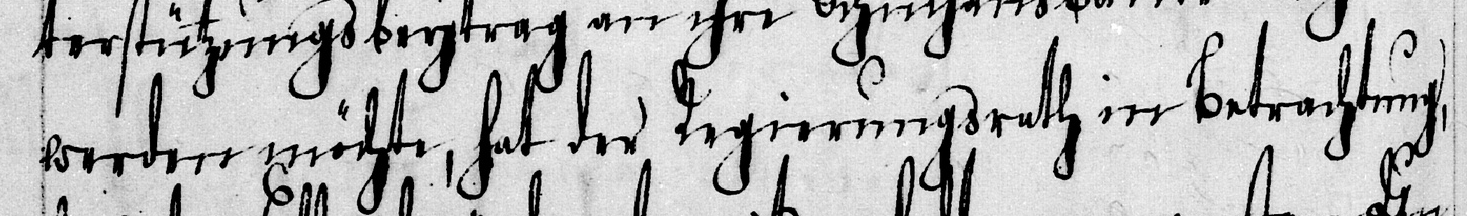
werden möchte, hat der Regierungsrath in Betrachtung,
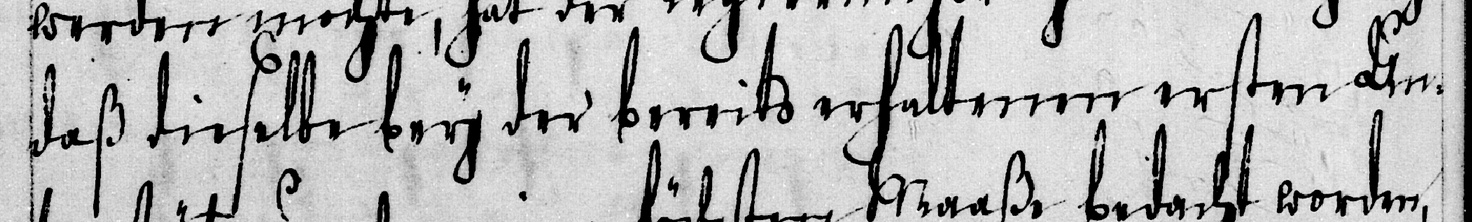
daß dieselbe bey der bereits erhaltenen ersten Un¬
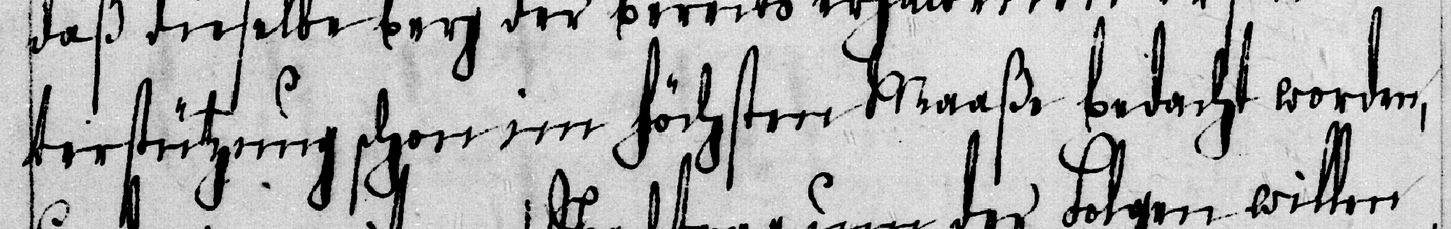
terstützung schon im höchsten Maaße bedacht worden,
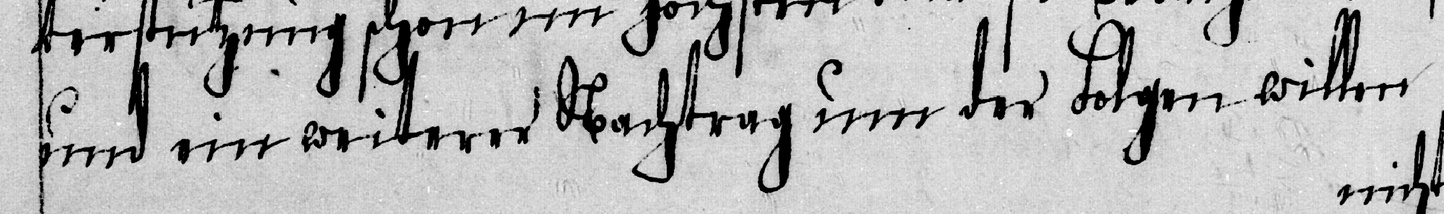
und ein weiterer Nachtrag um der Folgen willen
